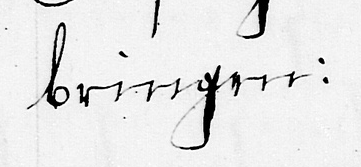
bringen:
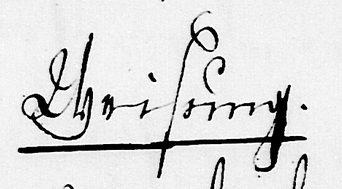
Weisung.
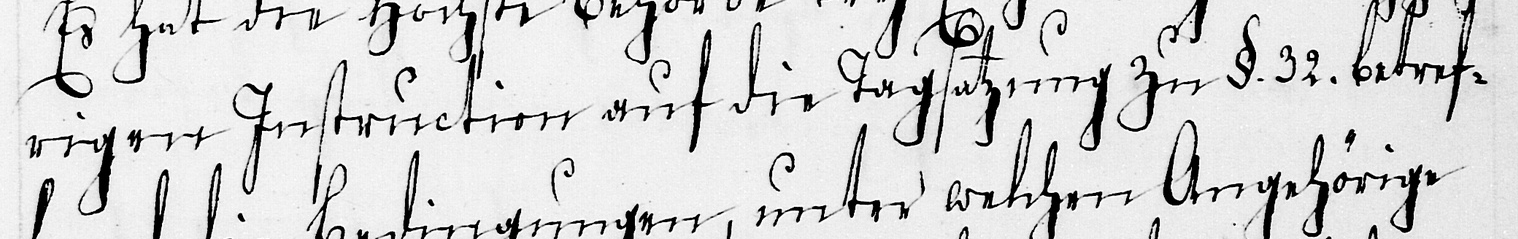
igen Instruction auf die Tagsatzung zu §. 32. betref¬
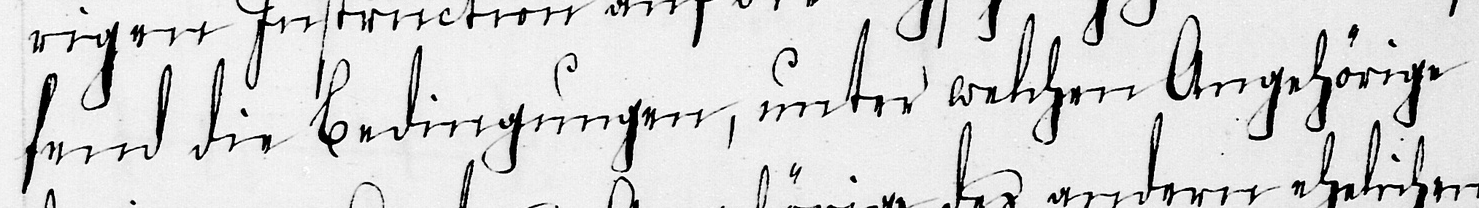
fende die Bedingungen, unter welchen Angehörige
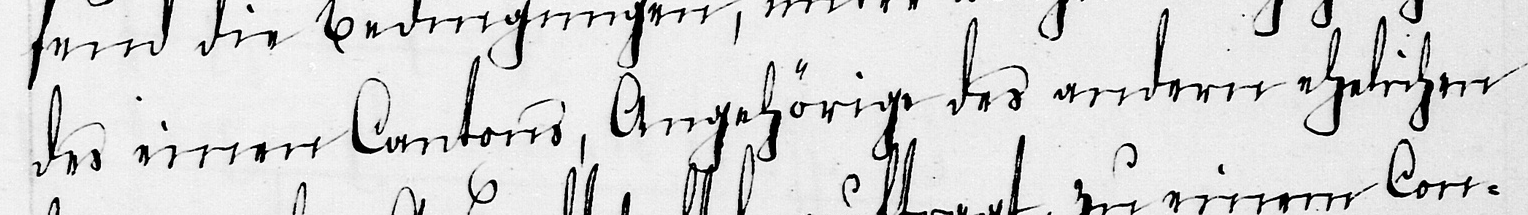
des einen Cantons, Angehörige des andern ehelichen
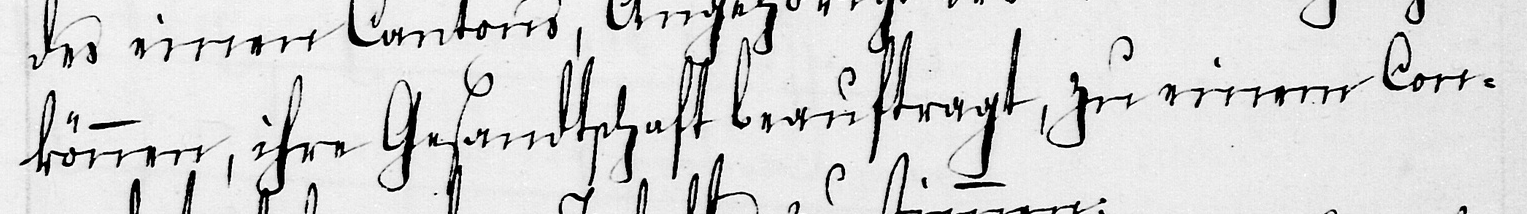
können, ihre Gesandtschaft beauftragt, zu einem Con¬
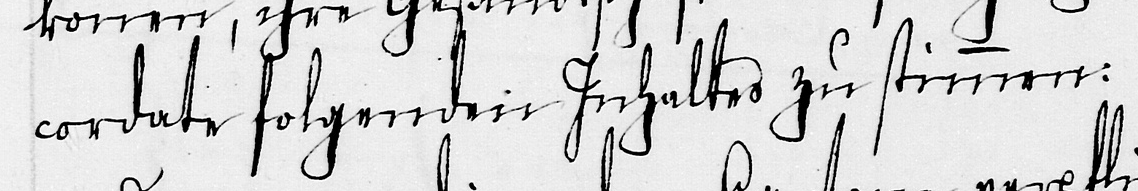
cordate folgenden Inhaltes zu stimmen:
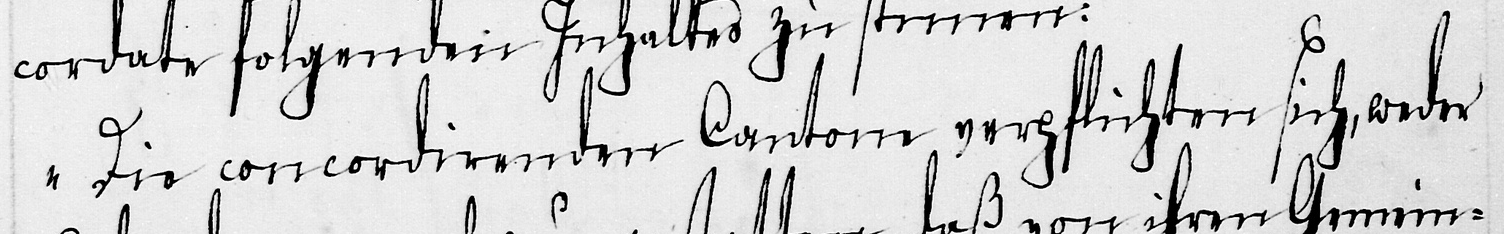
„Die concordirenden Cantone verpflichten sich, we¬
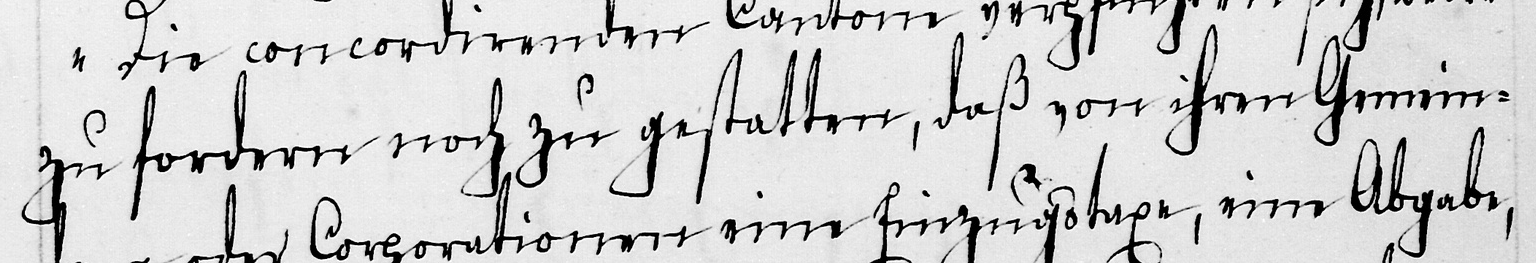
zu fordern noch zu gestatten, daß von ihren Gemein¬
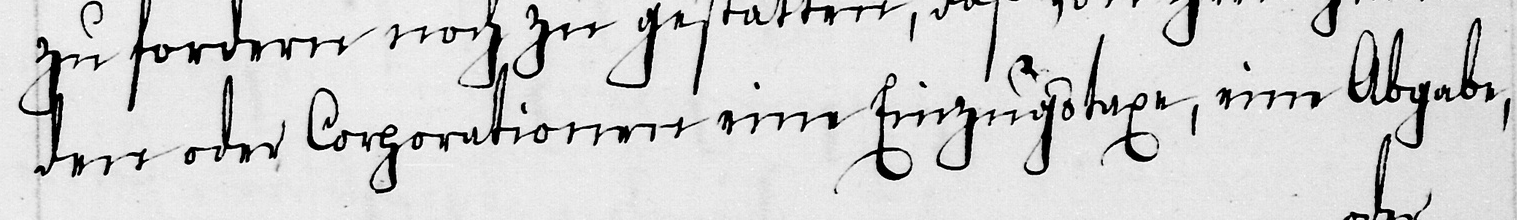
den oder Corporationen eine Einzugstaxe, eine Abgabe,
